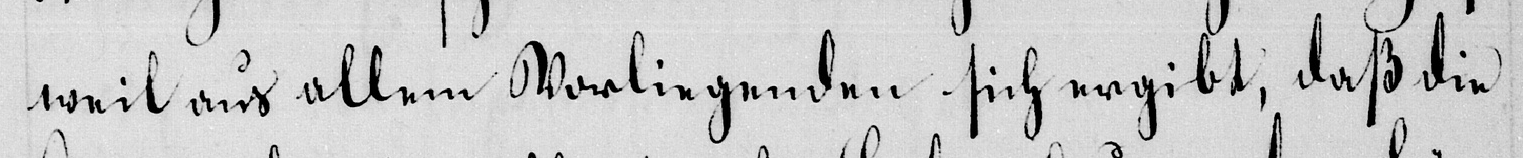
weil aus allem Vorliegenden sich ergibt, daß die
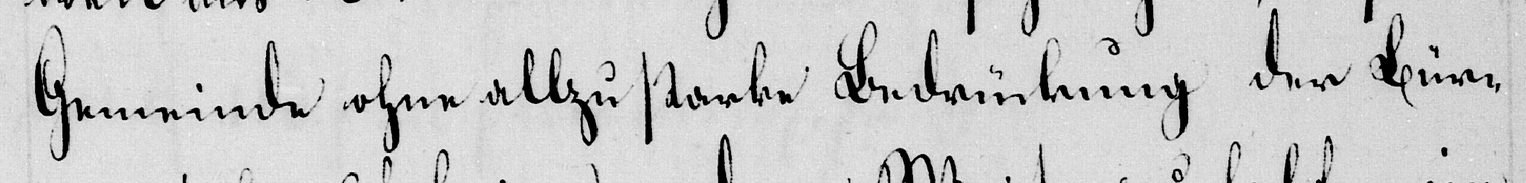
Gemeinde ohne allzustarke Bedrückung der Bür¬
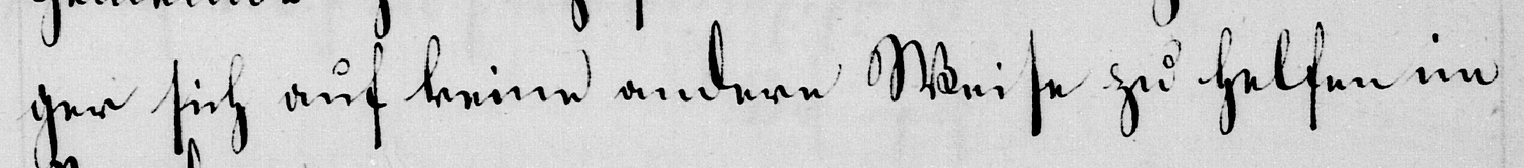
ger sich auf keine andere Weise zu helfen im
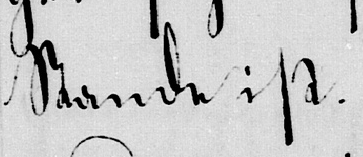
Stande ist.
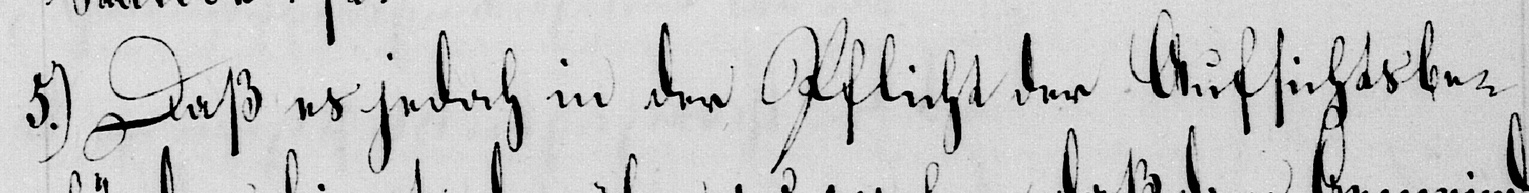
5.) Daß es jedoch in der Pflicht der Aufsichtsbe¬
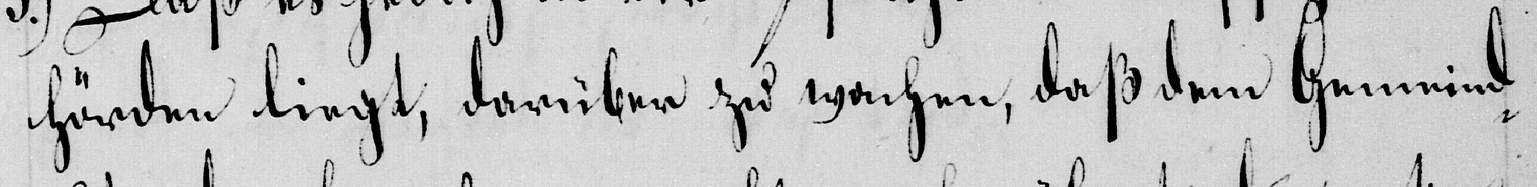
hörden liegt, darüber zu wachen, daß dem Gemeind¬
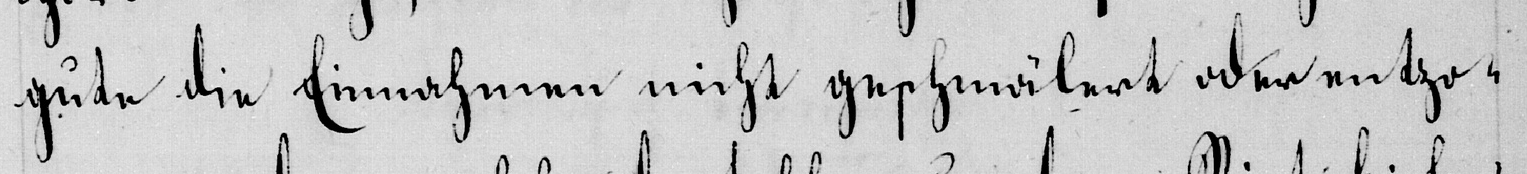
gute die Einnahmen nicht geschmälert oder entzo¬
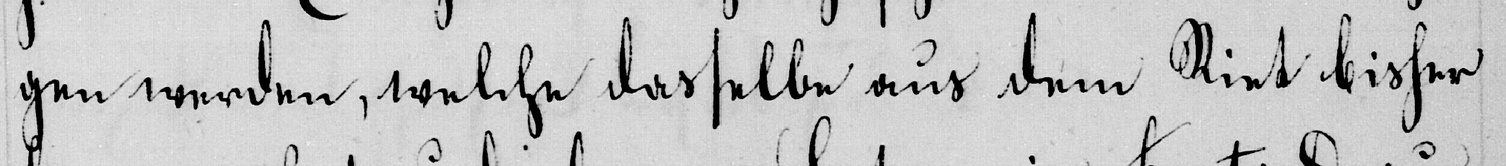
gen werden, welche dasselbe aus dem Riet bisher
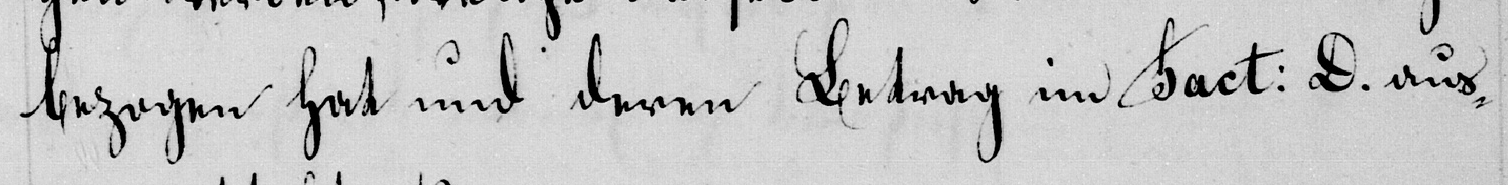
bezogen hat und deren Betrag im Fact: D. aus¬
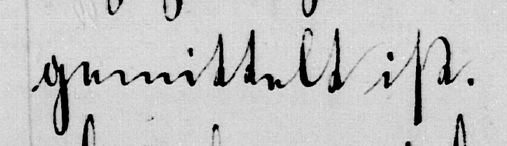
gemittelt ist.
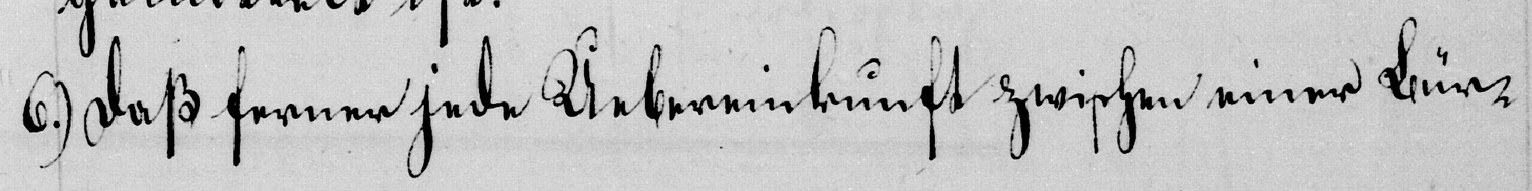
6.) Daß ferner jede Uebereinkunft zwischen einer Bür-
